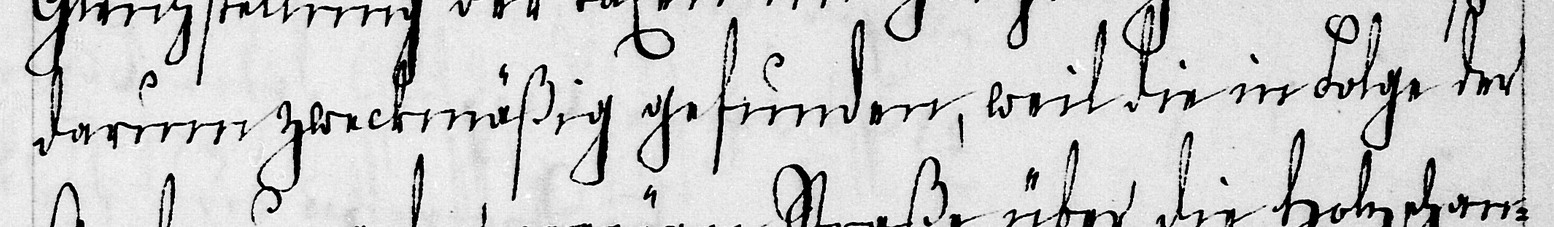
darum zweckmäßig gefunden, weil die in Folge der
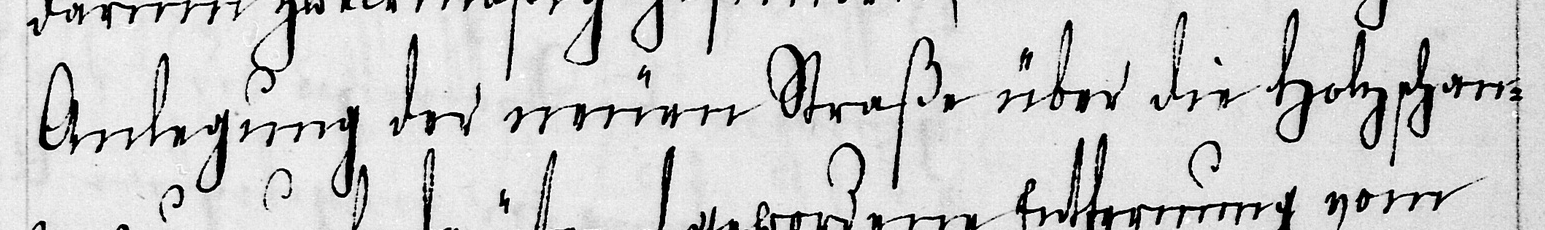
Anlegung der neuen Straße über die Holzschan¬
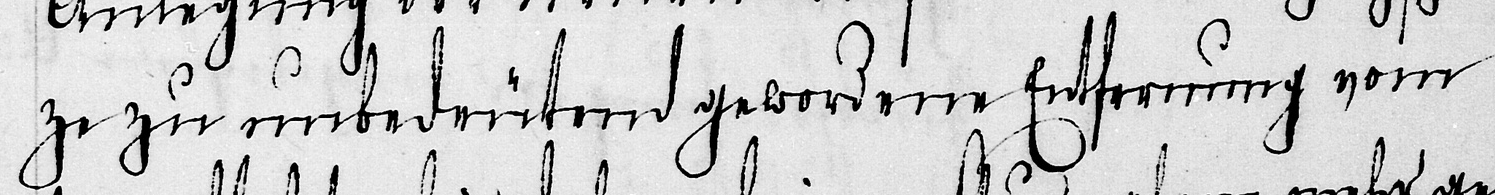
ze zu unbedeutend gewordene Entfernung vom
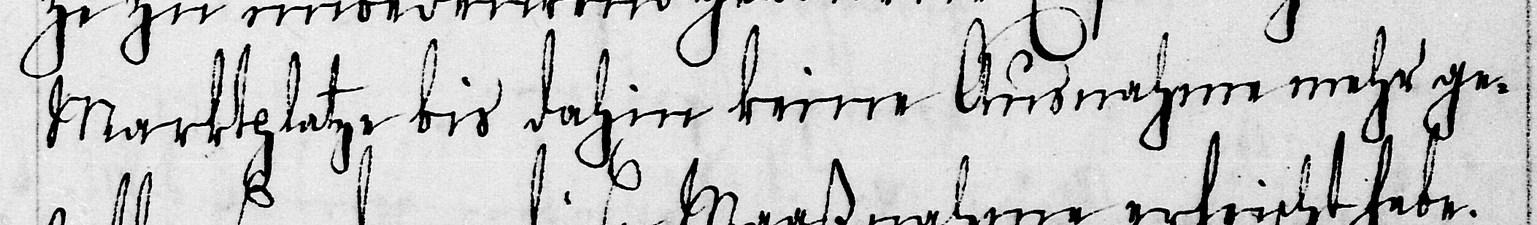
Marktplatze bis dahin keine Ausnahme mehr ge¬
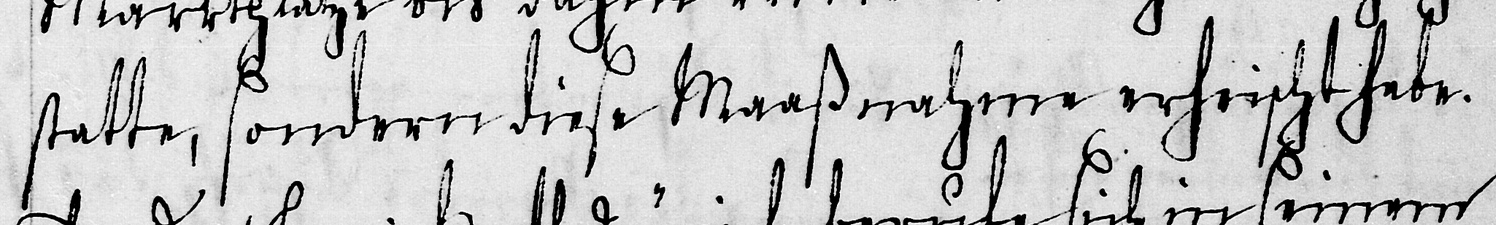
statte, sondern diese Maaßnahme erheischt habe.
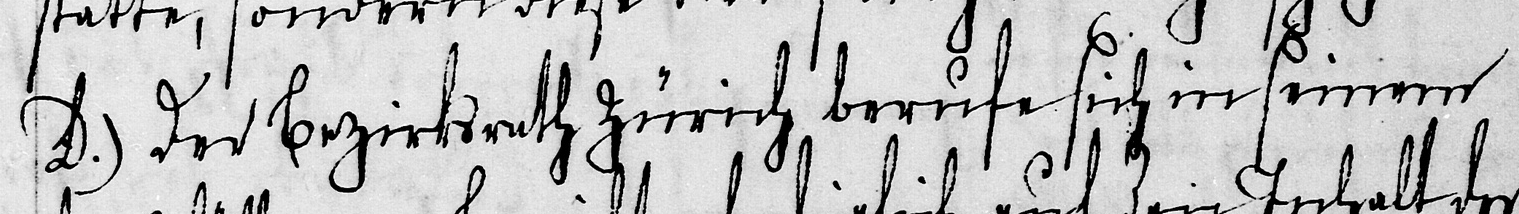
D.) Der Bezirksrath Zürich berufe sich in seinem
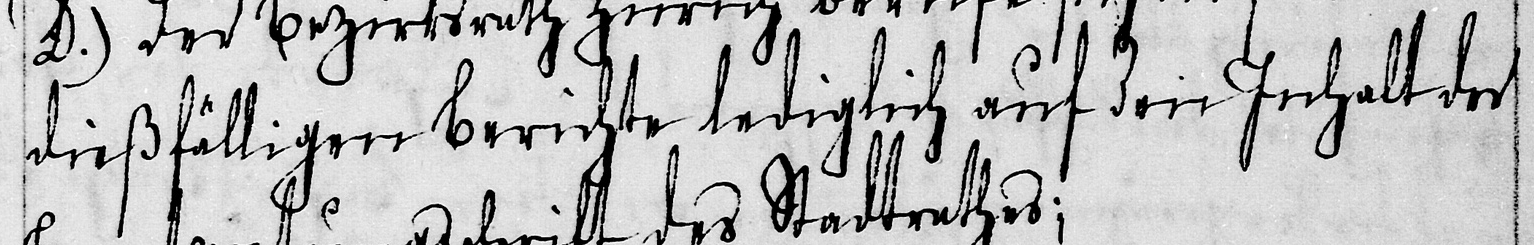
dießfälligen Berichte lediglich auf den Inhalt der
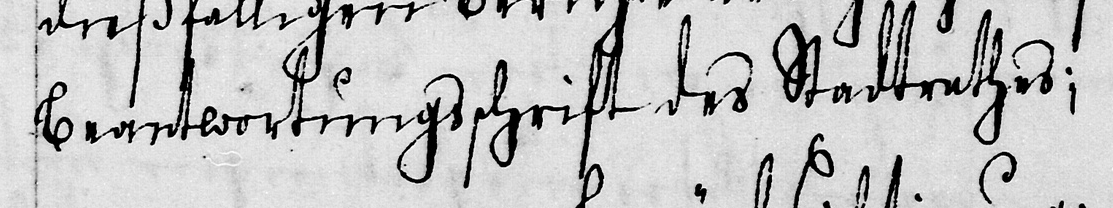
Beantwortungsschrift des Stadtrathes;
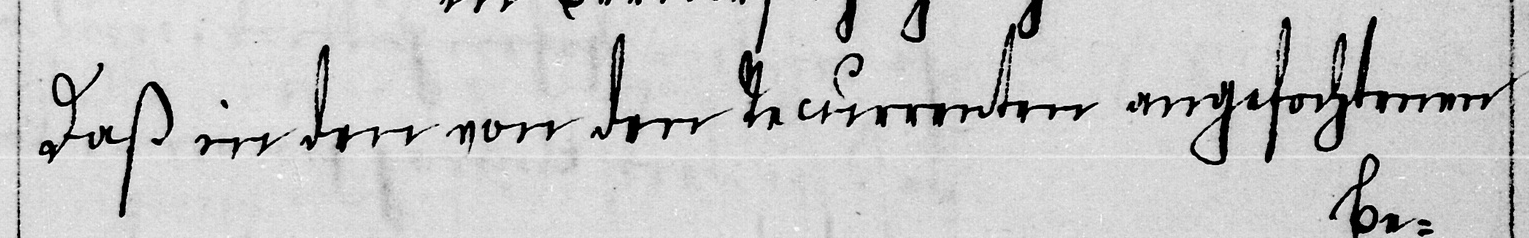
Daß in den von den Recurrenten angefochtenen
